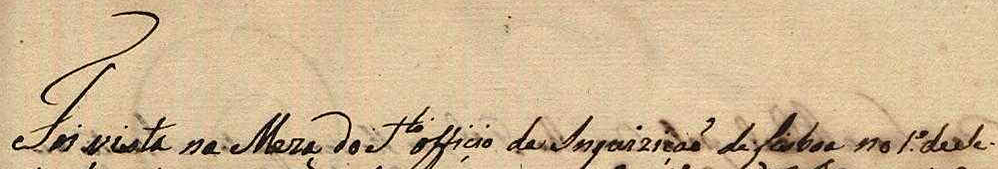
Foi vista na Meza do Sto officio da Inquiziçaõ de Lisboa no 1.o de Se
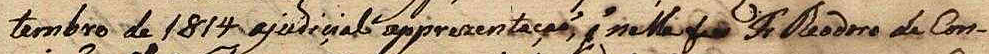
tembro de 1814 a judicial apprezentaçaõ, q̄ nella fes Fr Theodoro da Con
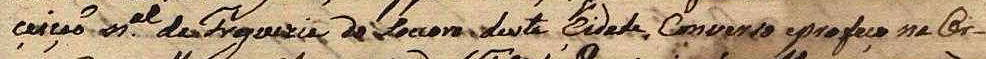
ceiçaõ n.al da Freguezia de soccoro desta Cidade, Converso e profeço na Or
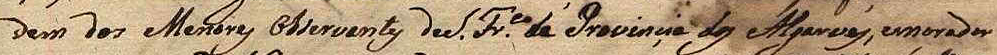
dem dos Menores Observantes de S. Fr.co de Provincia dos Algarves, e morador
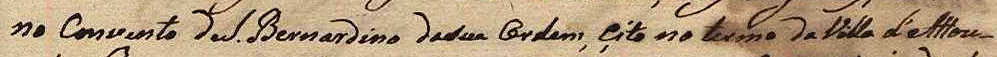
no Convento de S. Bernardino da sua Ordem, cito no termo da Villa d'Attou
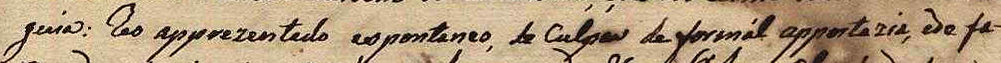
guia: Reo apprezentado espontaneo, de culpa de formál appostazia, e de fa
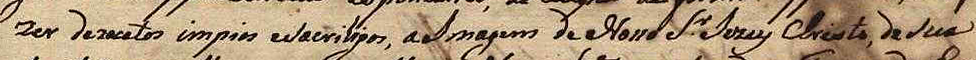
zer dezacatos impios e sacriligos, a Imagem de Nosso S.r Iezus Christo, de sua
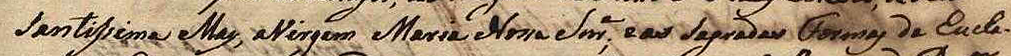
santissima May, a Virgem Maria Nossa Snr̄.a, e as sagradas Formas da Eucha
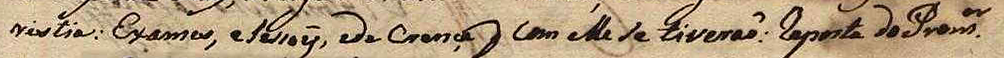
ristia: Exames, e sessoẽs, e de crença q̄ com elle se tiveraõ: Reposta do Prom.or
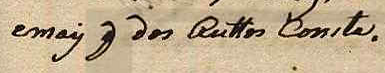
e mais q̄ dos Auttos Consta.
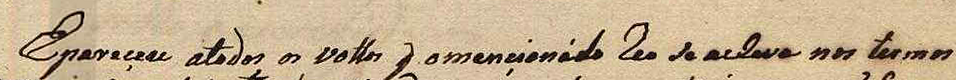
E pareceu a todos os vottos q̄ o mencionádo Reo se achava nos termos
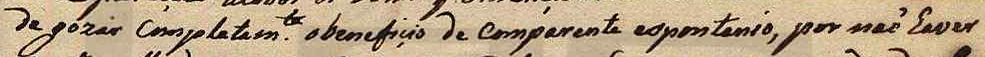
de gozar completam.te o beneficio de comparente espontanio, por naõ haver
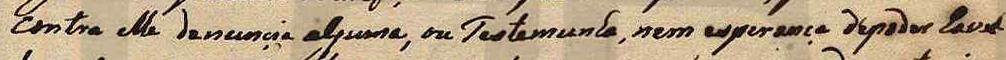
contra elle denuncia alguma, ou Testemunho, nem esperança de poder have
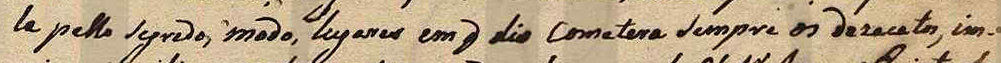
la pello segredo, modo, lugares em q̄ dis cometera sempre os dezacatos, im
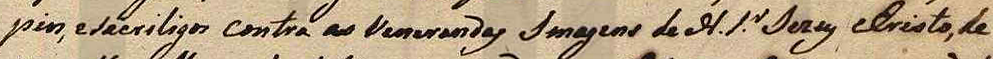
pios, e sacriligos contra as venerandas Imagens de N. S.r Iezus christo, de
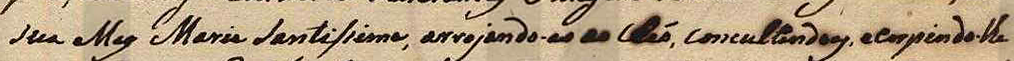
sua May Maria santissima, arrojando-as ao Chaõ, conculcandoas, e cospindo-lhe
